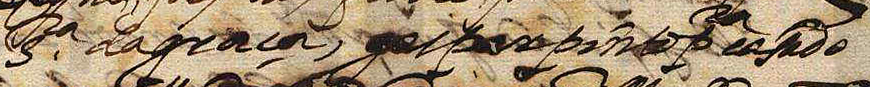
s.ra da graça, gaspar pinto pra casado
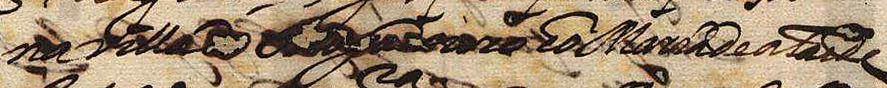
na villa _ Mogadouro cō Maria de ataide
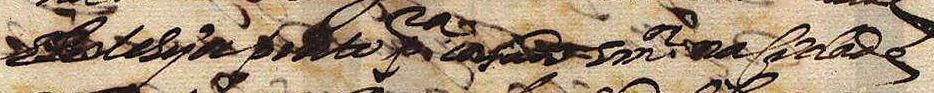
E Belchior pinto p.ra casado E mor na Cidade
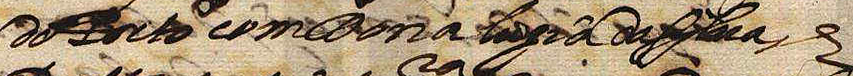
do Porto com Dona luzia da sjlua, E
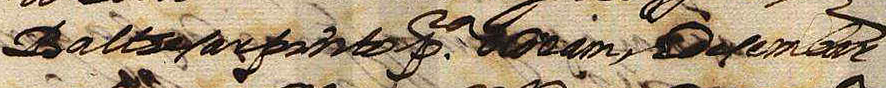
Balthesar pinto p.ra o deam, E desembar
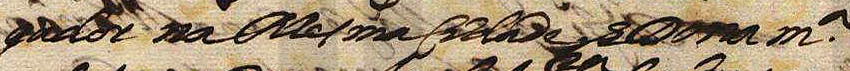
gador na Mesma Cidade, e Dona m.a
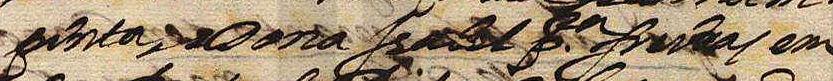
pinta, Dona Jsabel p.ra freiras em
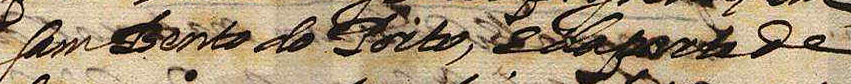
sam Bento do Porto, e da parte de
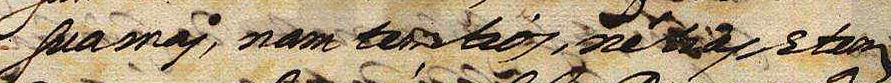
sua maj, nam tem tios, nē tias, E tem
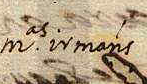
m.as irman̄s
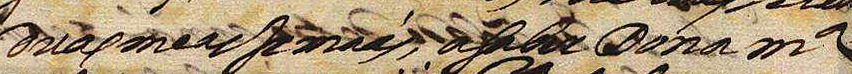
duas meas Jrmaās, a saber Dona ma
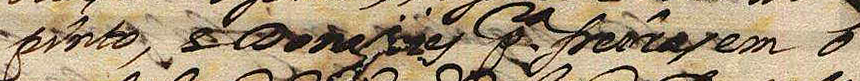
pinto, E Dona jnes p.ra freiras em o
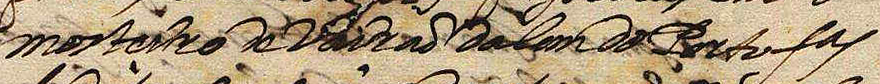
mosteiro de Vairaõ dalem do Porto fas
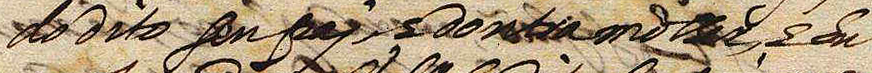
do dito seu paj, e doutra molher, E hū
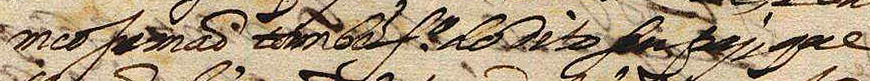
meo Jrmaõ tambē f.o do dito seu paj que
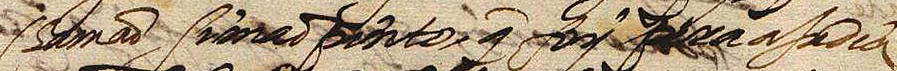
Chamaõ simaõ pinto, q̄ foy pera a Jndia
